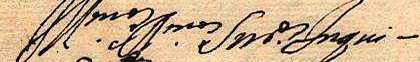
Jll.mos e R.mos Snr.es Jnqui
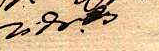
zidr.es
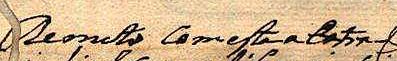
Remeto com esta a letra
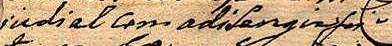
judicial com a diLengia fei
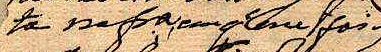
ta na fr.a, em q̄ me foi
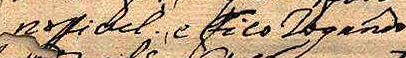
possivel., e fico Rogando
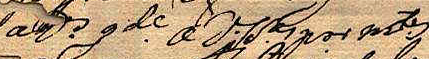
a D.s gde. a V.Ss.as por mt.os
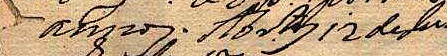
annos. Abr.tes i2 de Ju
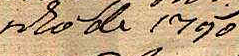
nho de 1790
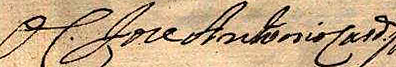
O C. Joze Antonio Card.o
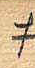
7
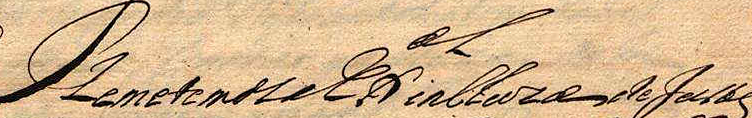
Remetemos a Ex.al incLuza de Justi
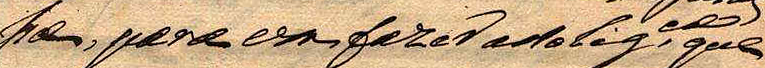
ssa, para vm fazer a deligça que
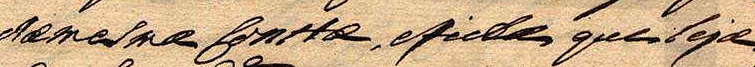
da mesma Consta, e feita que seja
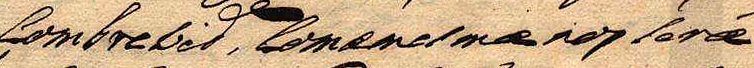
com brevide com a mesma nos será
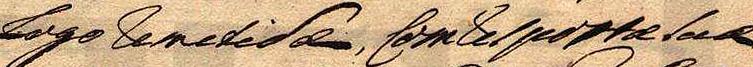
Logo Remetida, Com Resposta sua
